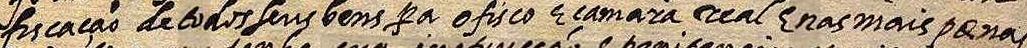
fiscaçaõ de todos seus bens ꝑa o fisco e camara real e nas mais penas
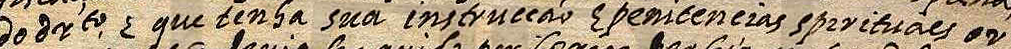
do dirto. e que tenha sua instruccaõ e penitencias spirituaes or
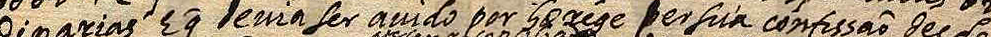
dinarias E q̄ devia ser avido por herege per sua confissaõ desde
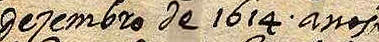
dezembro de 1614. anos
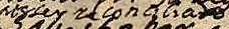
ate ser reconciliado
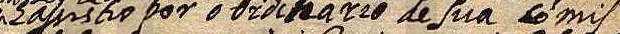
e assistio por o Ordinario de sua cómis
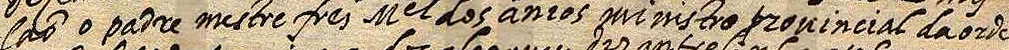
saõ o padre mestre frei Mel dos anios ministro prouincial da ordẽ
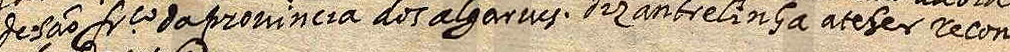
de saõ fr.co da provincia dos algarues. Diz antrelinha ate ser recon
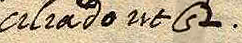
ciliado ut s̄p
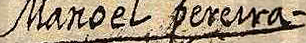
Manoel pereira
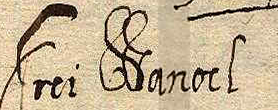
Frei Manoel
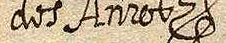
dos Anios
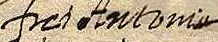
Frei Antonio
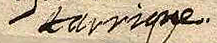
Aarrique
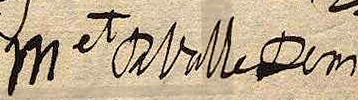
Mel do Valle De mzs
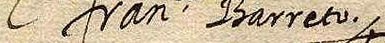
fran.co Barreto.
